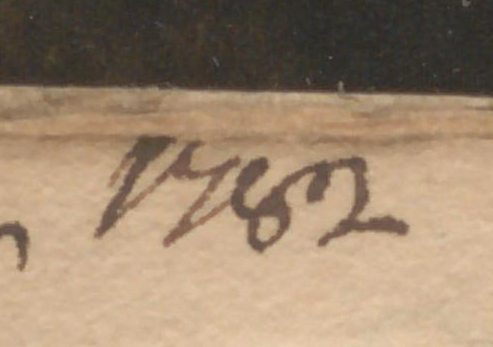1782
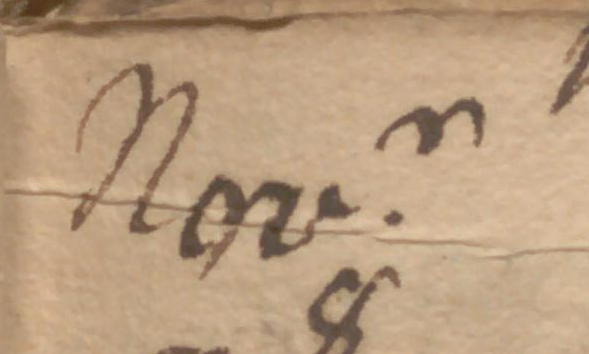Nov^r.
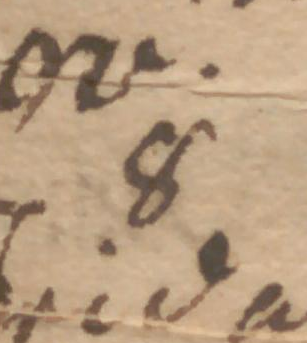8
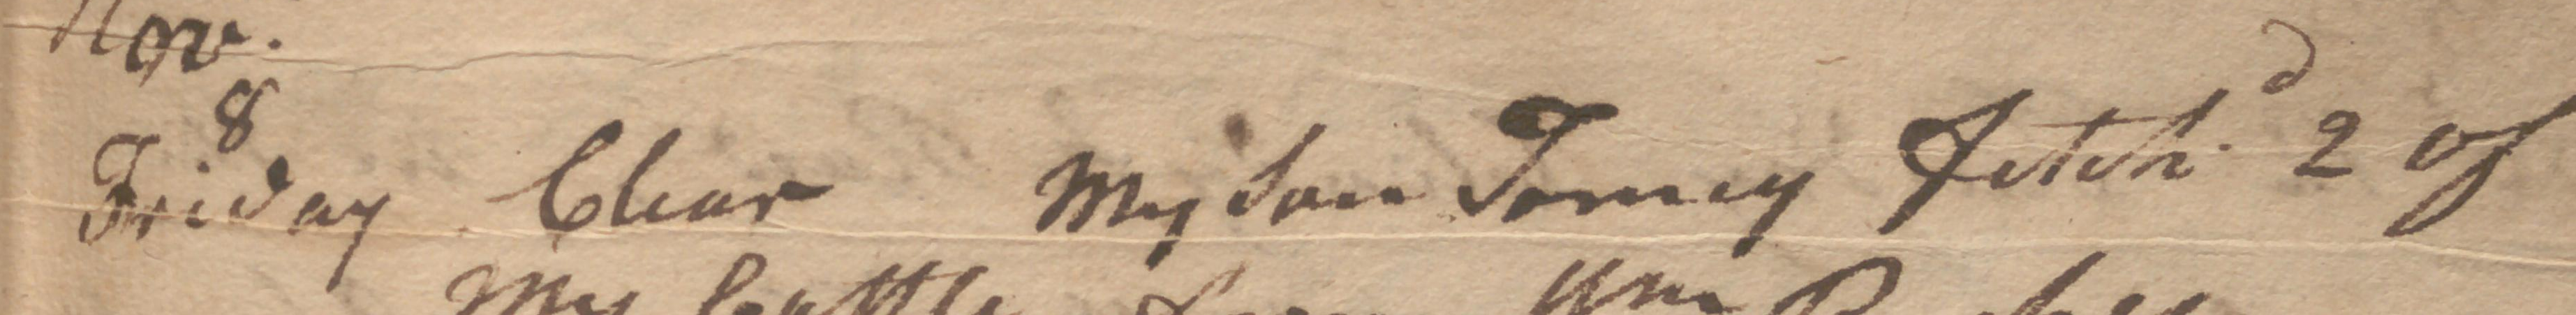Friday Clear My Son Tomey fetch^d 2 of
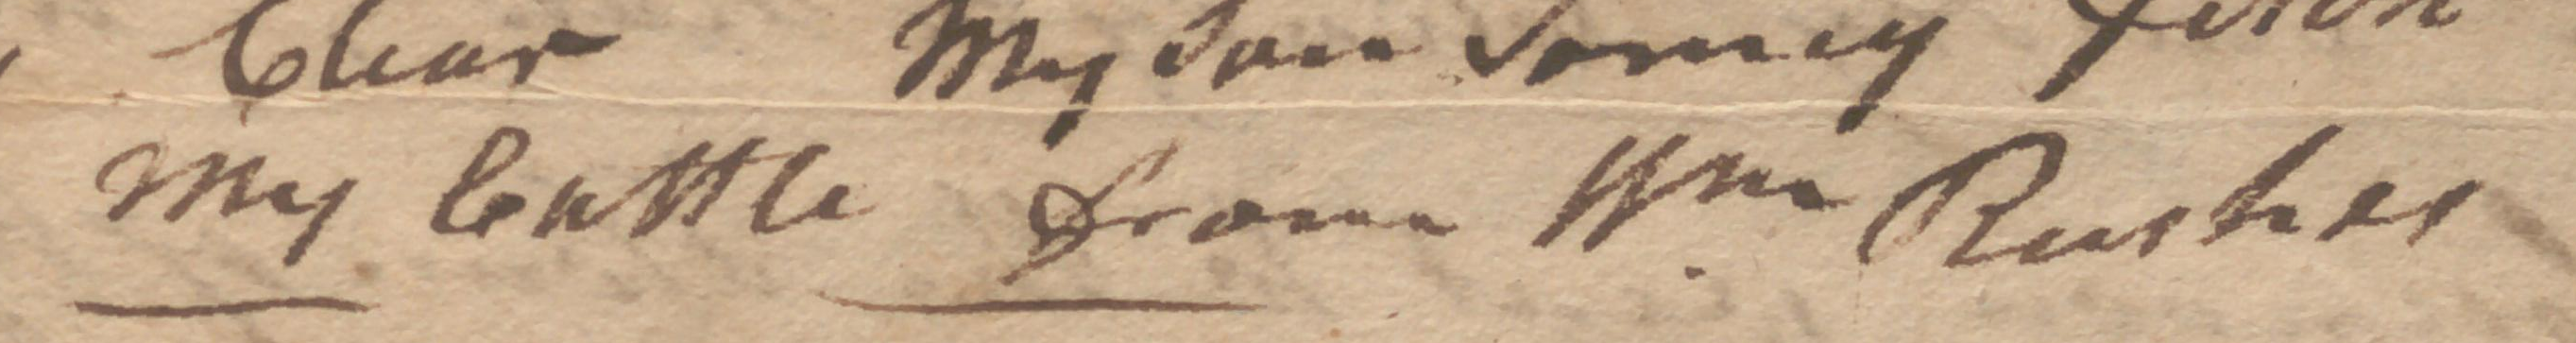My Cattle from W^m. Rushes
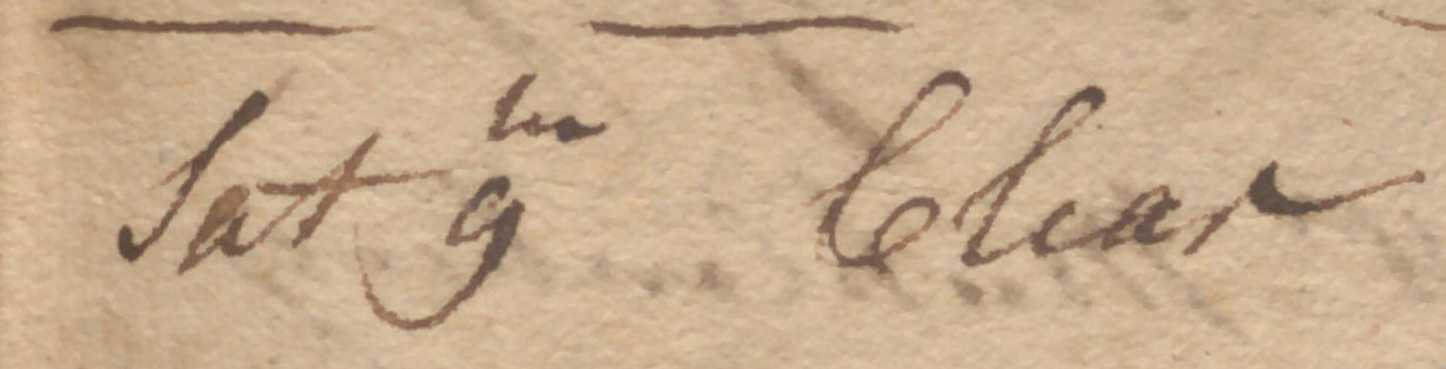Sat 9^th Clear
